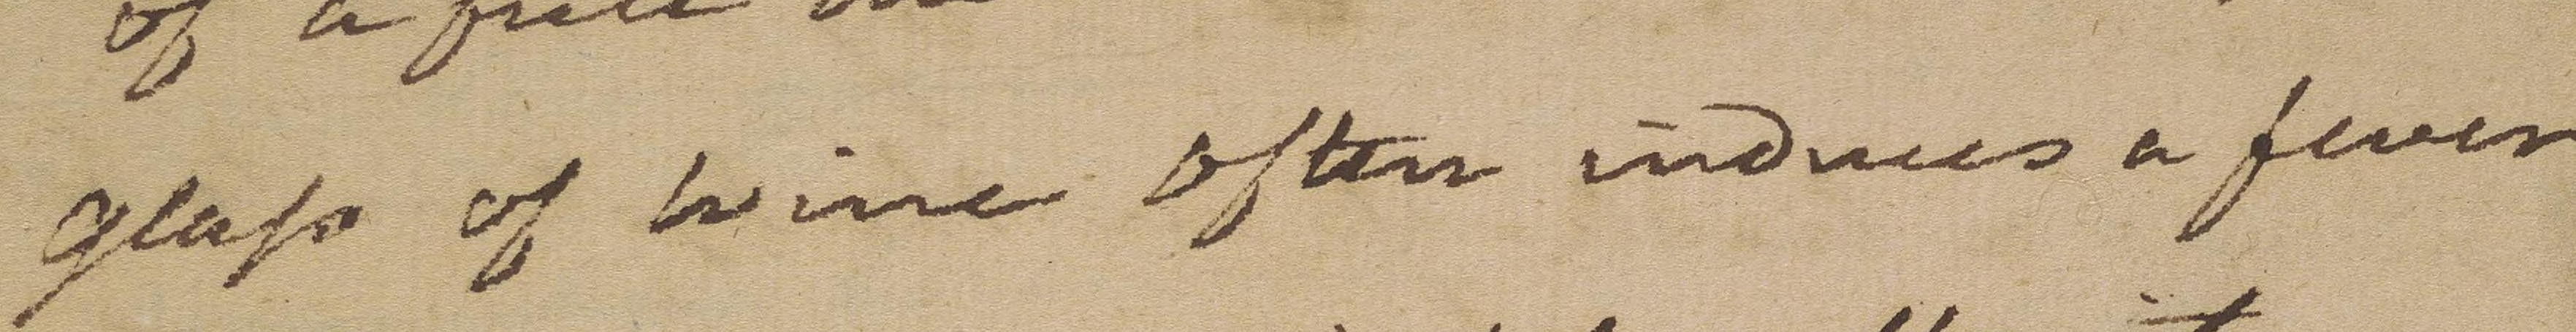glass of wine often induces a fever
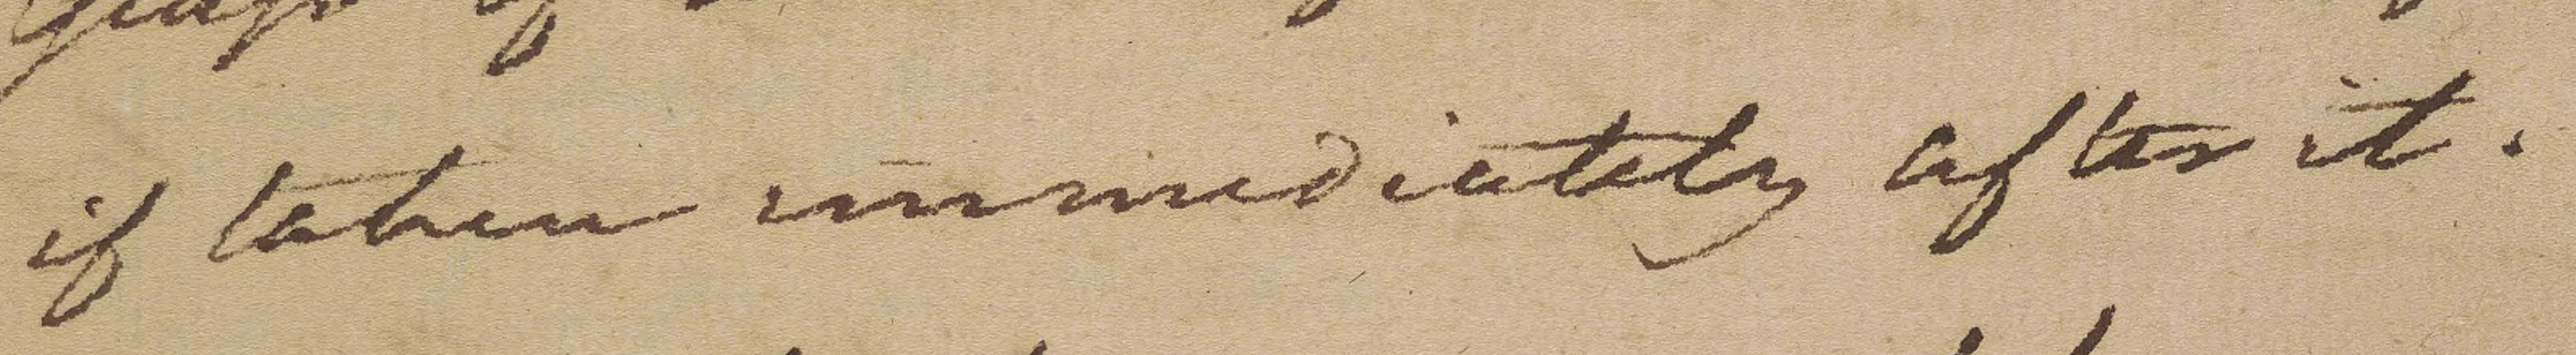if taken immediately after it
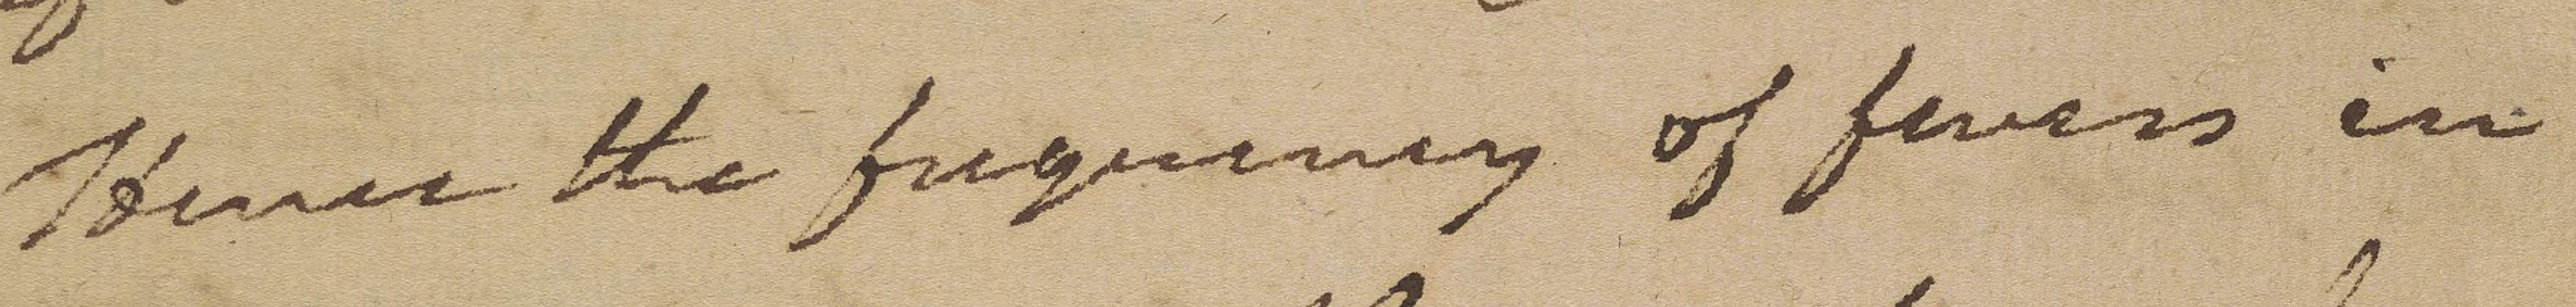Have the frequency of fevers in
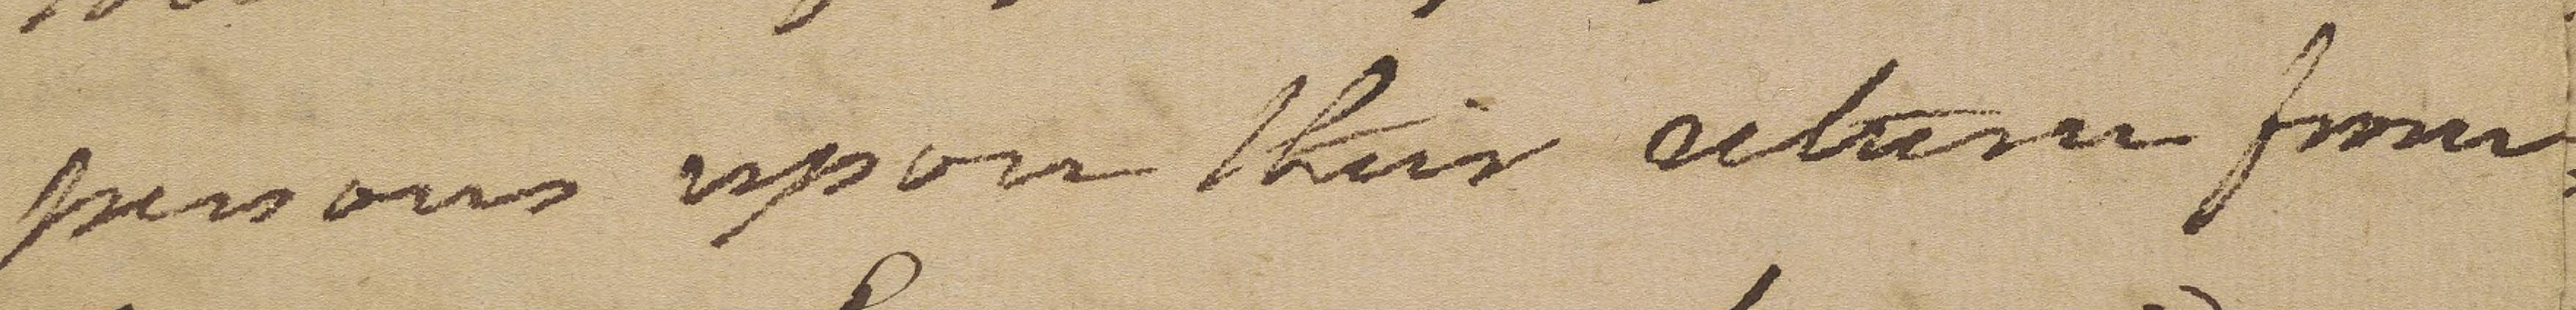persons upon their return from
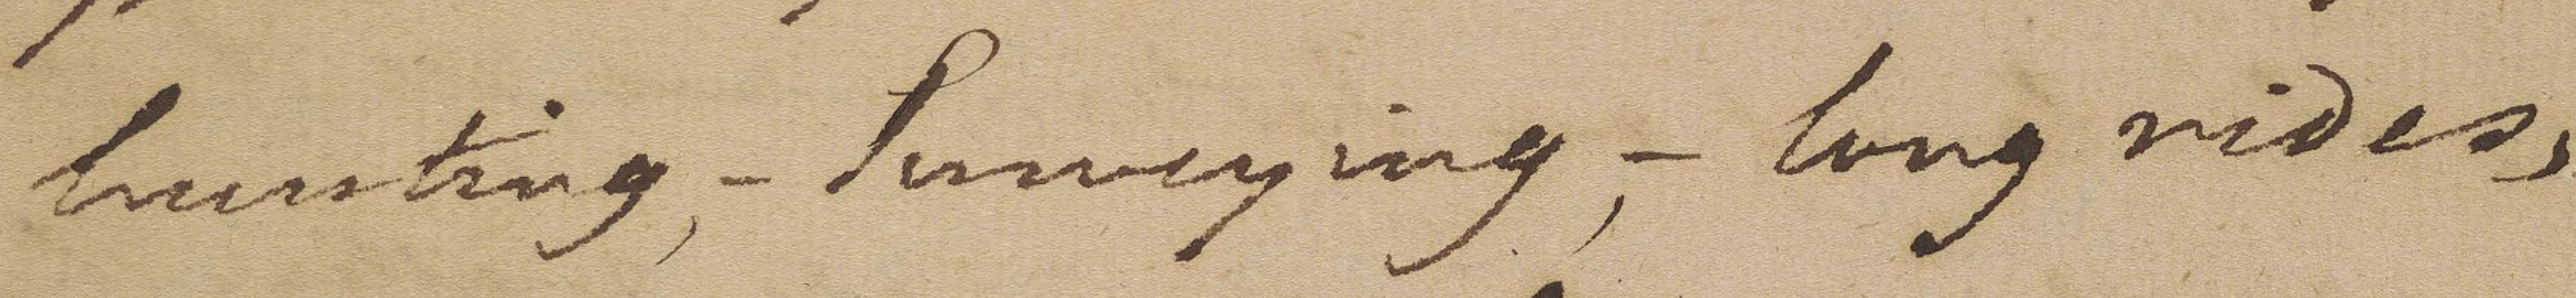hunting, swaying, long rides,
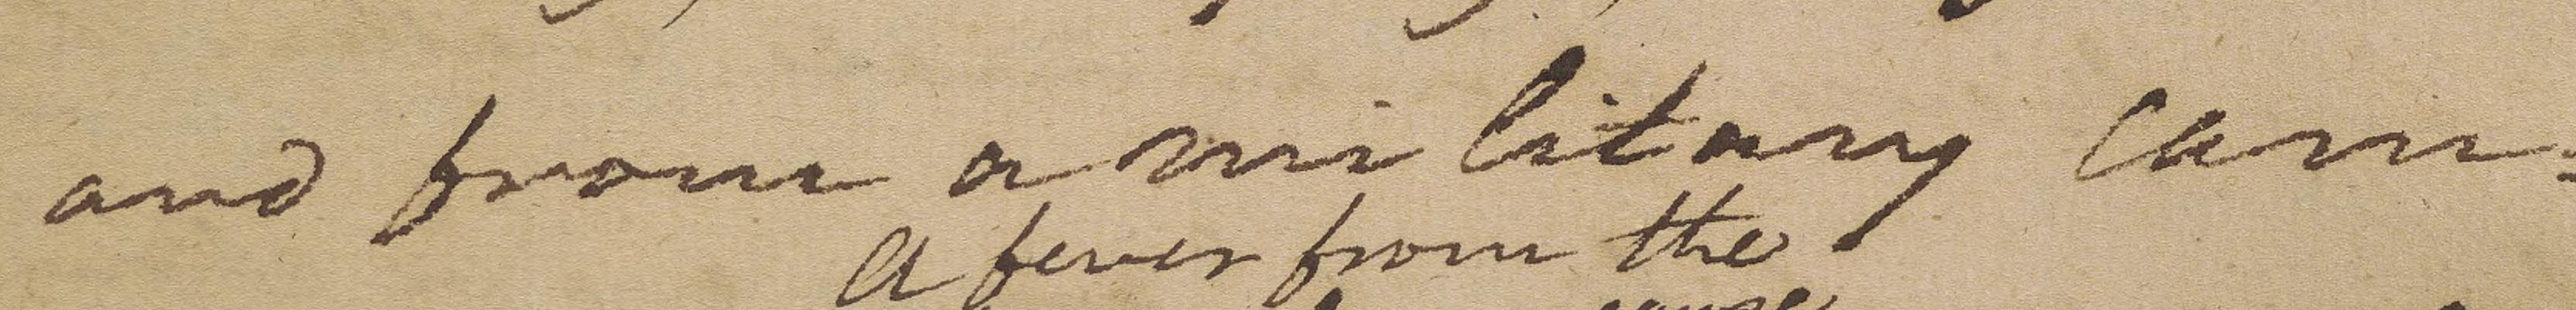and from a military cam-
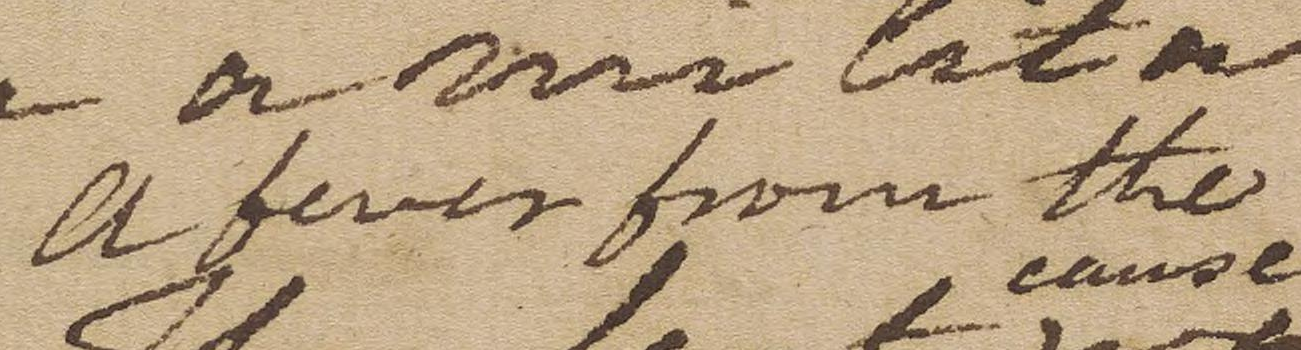a fever from the
